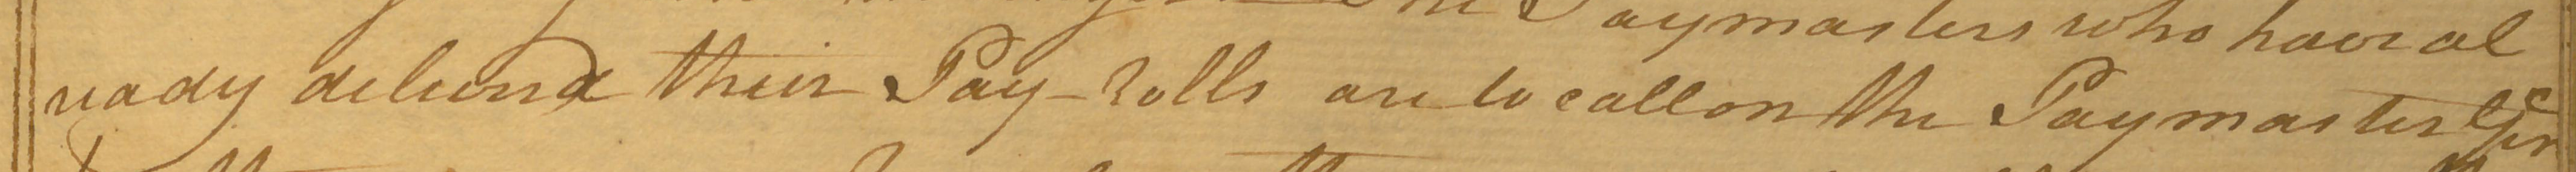ready deliverd their Pay-Rolls are to call on the Paymaster Gen^l
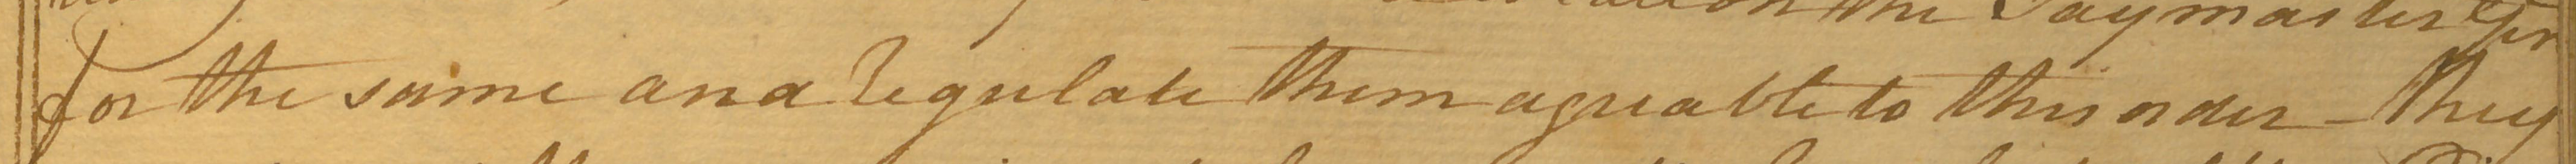for the same and regulate them agreable to this order- They
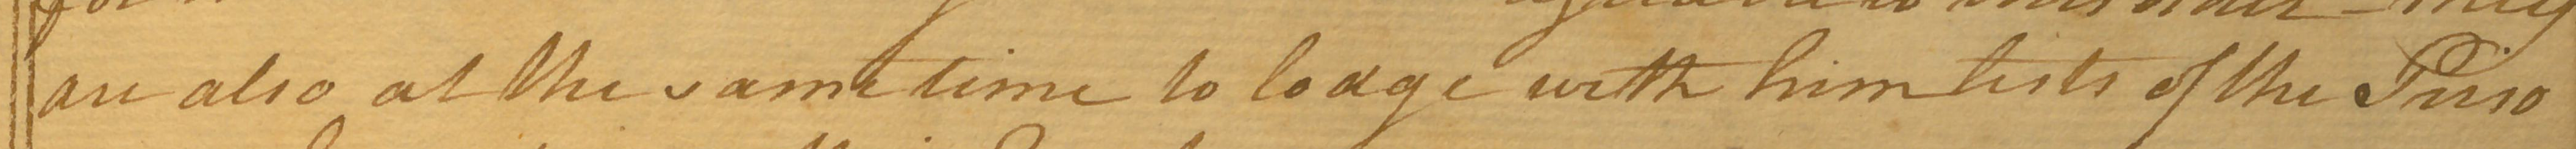are also at the same time to lodge with him lists of the Priso
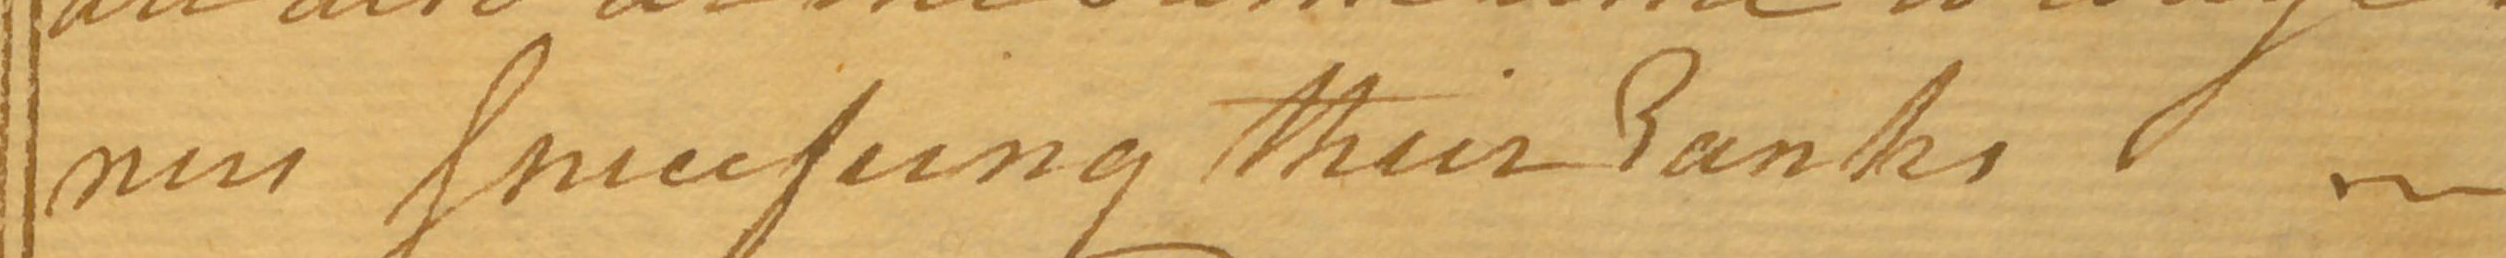ners specifiing their Ranks -
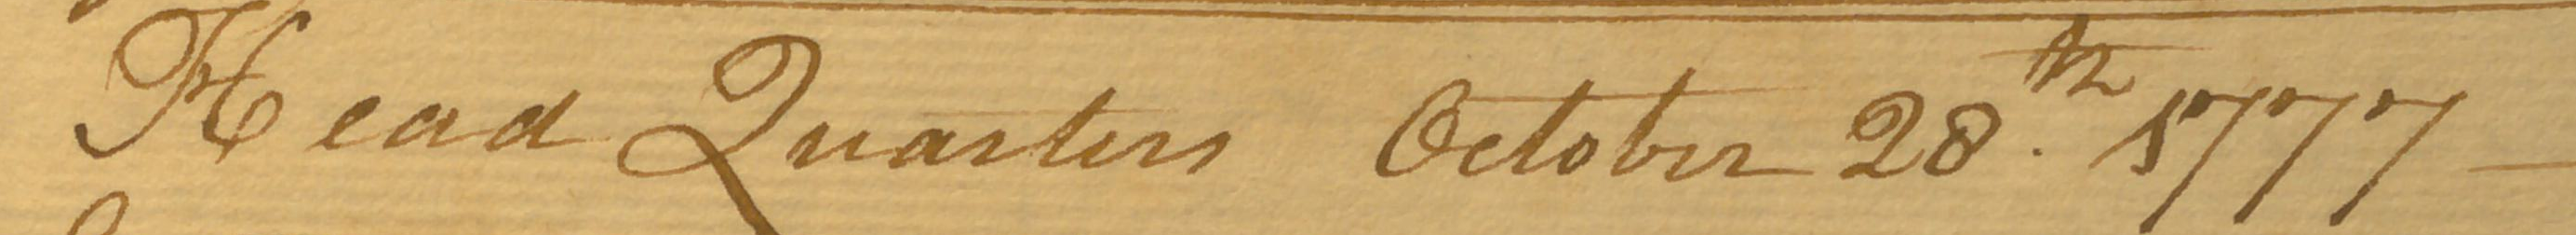Head Quarters October 28^th. 1777
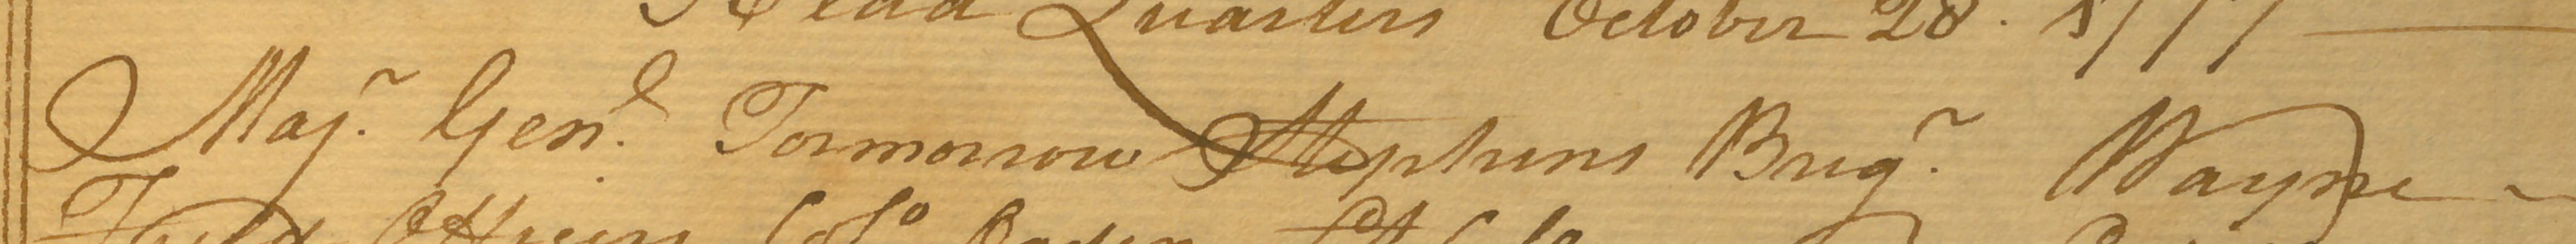Maj^r. Gen^l. Tomorrow Stephens Brig^r. Wayne-
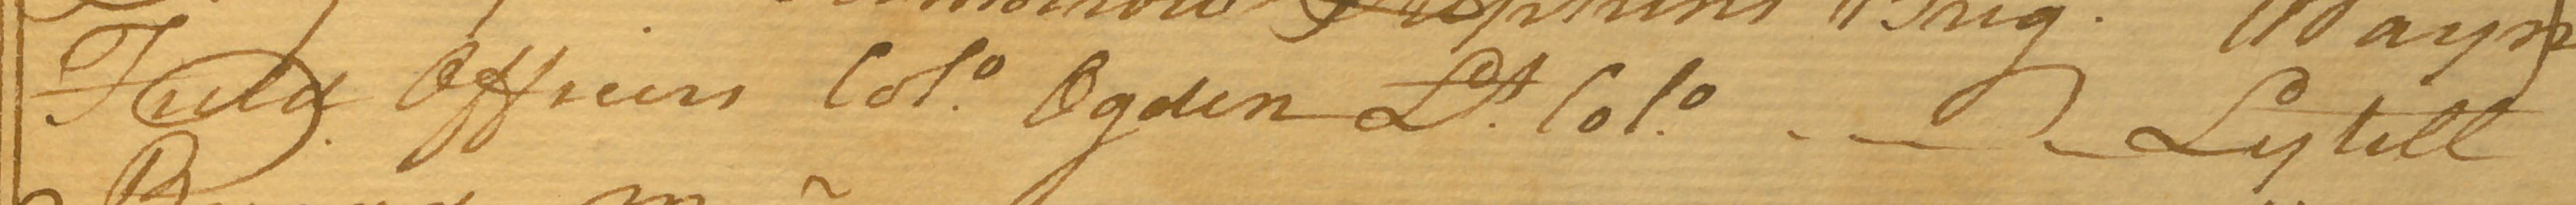Field Officers Col^. Ogden L^t. Col^o. - - Lytill
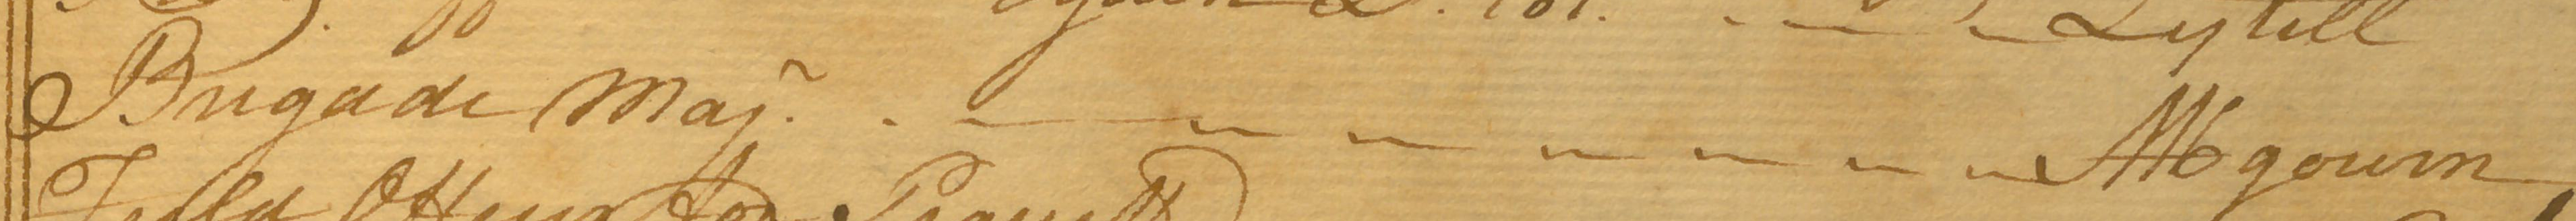Brigade Maj^r. . - - - - - - - MCgowin
